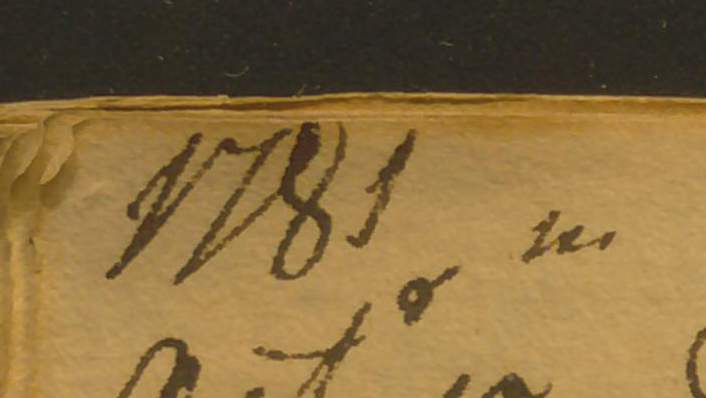1781
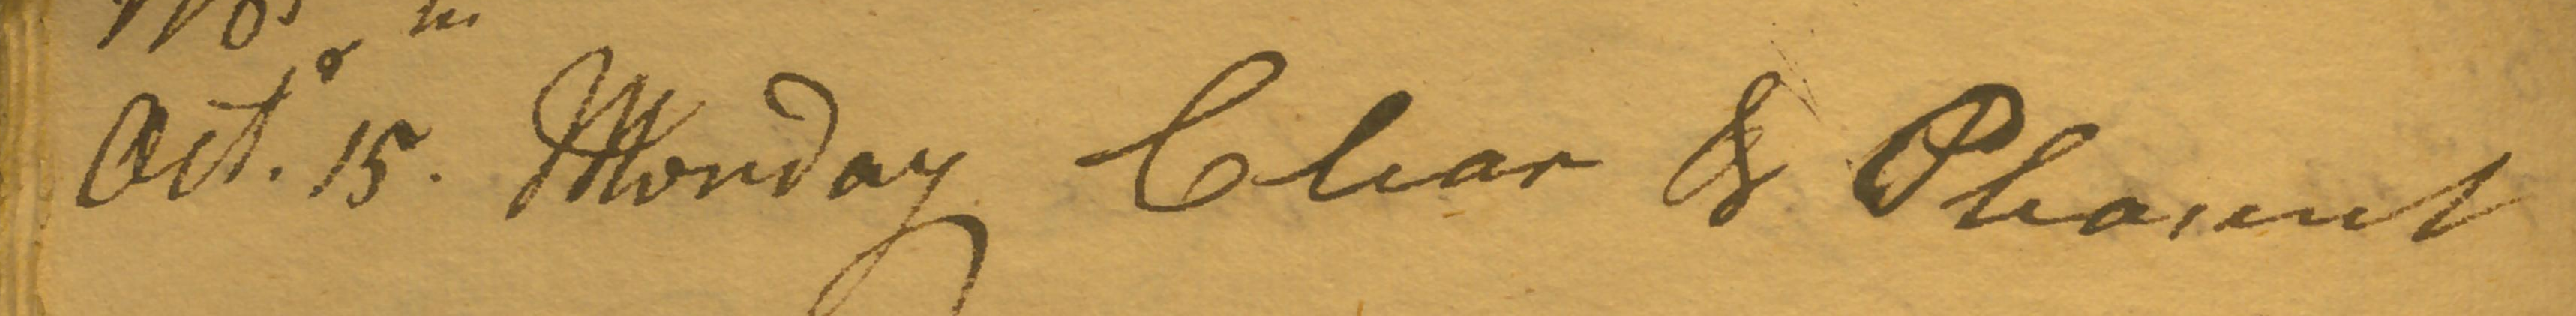Oct^r. 15^th. Monday Clear & Pleasent
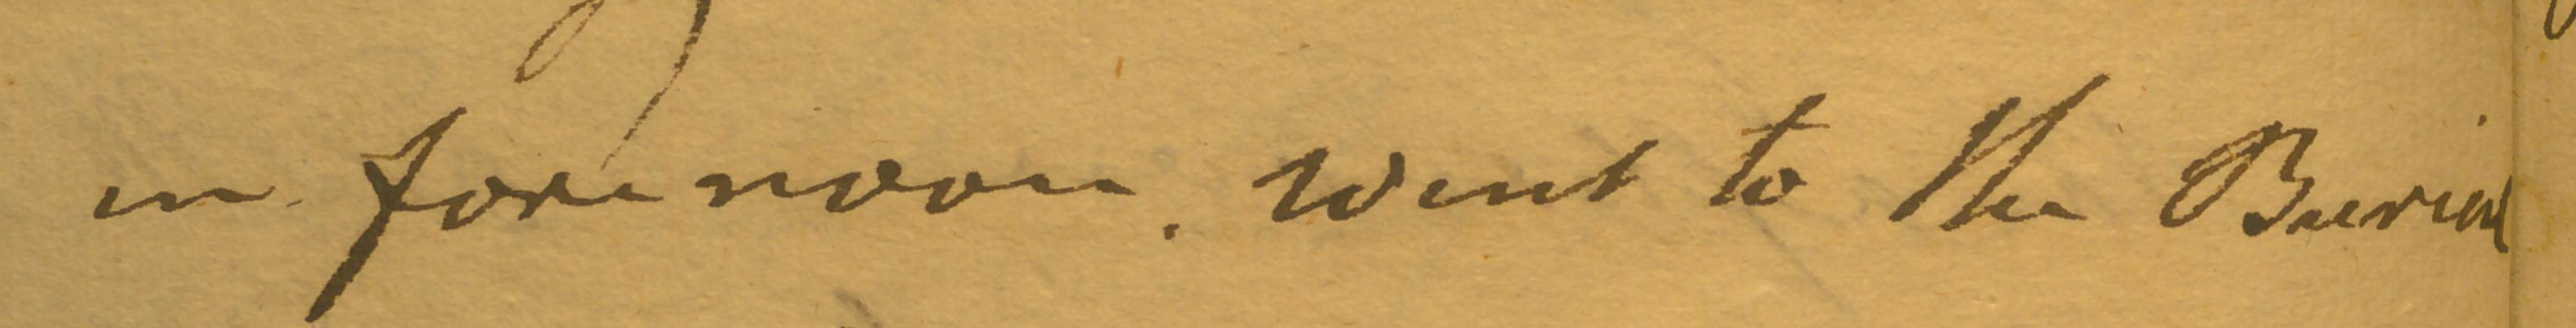in forenoon went to the Burial
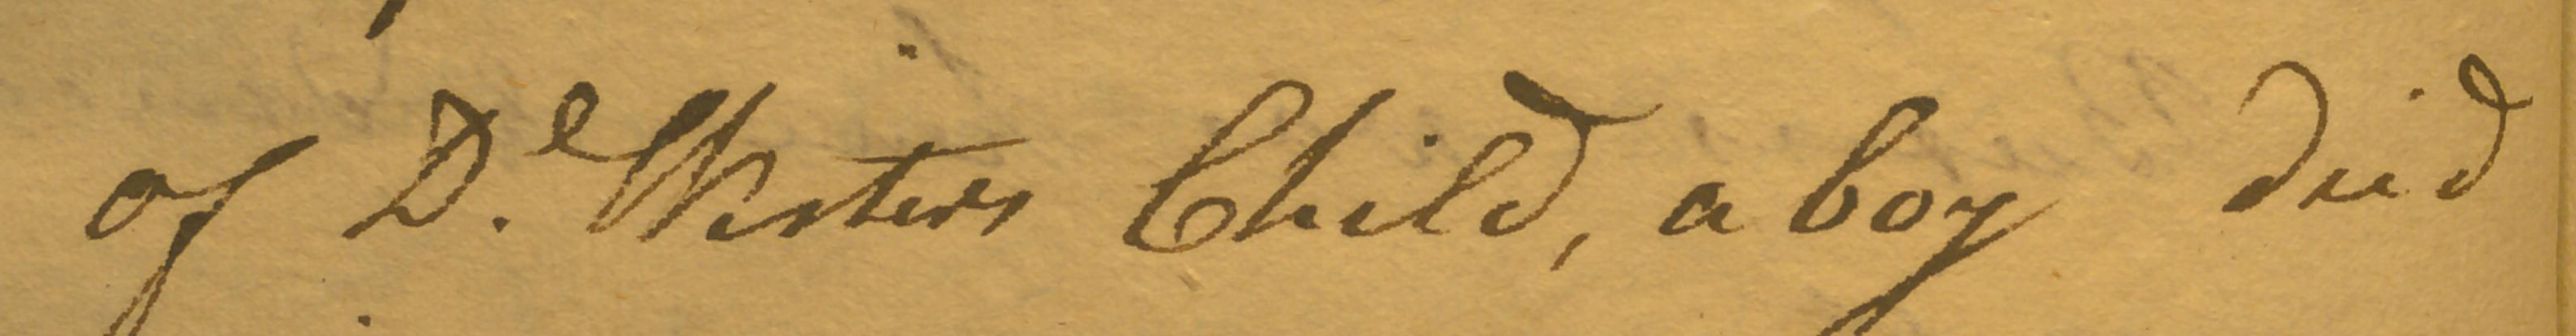of D^l. Wisters Child a boy died
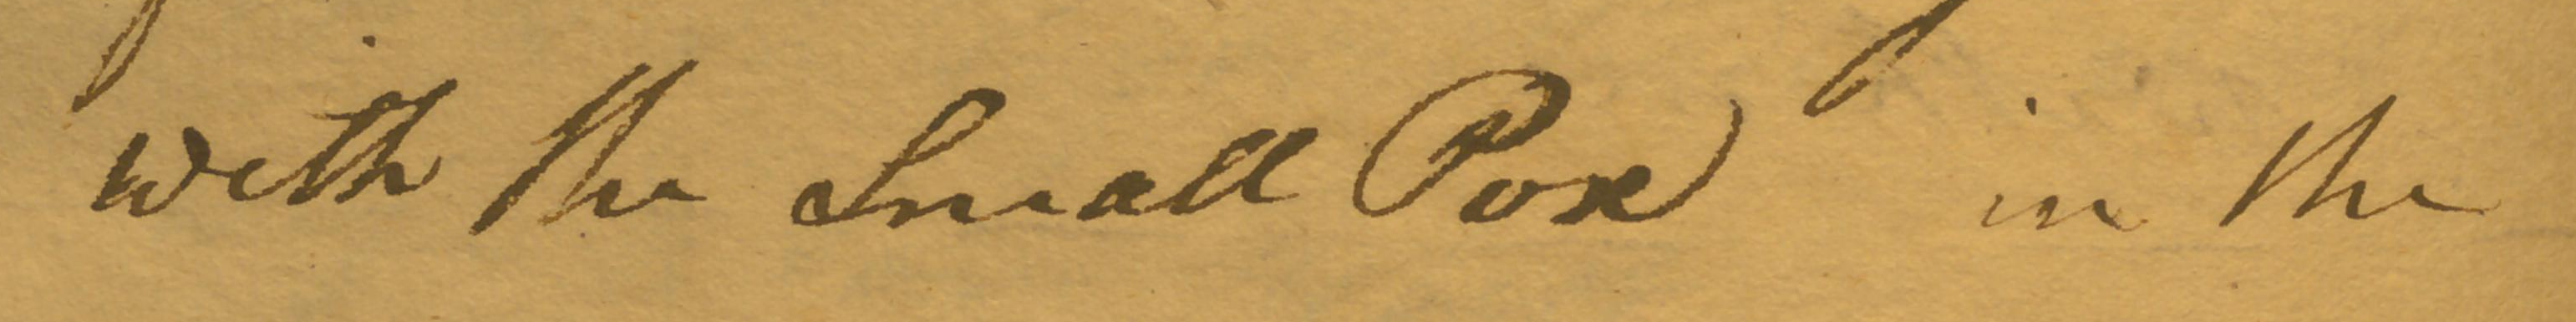with the Small Pox in the
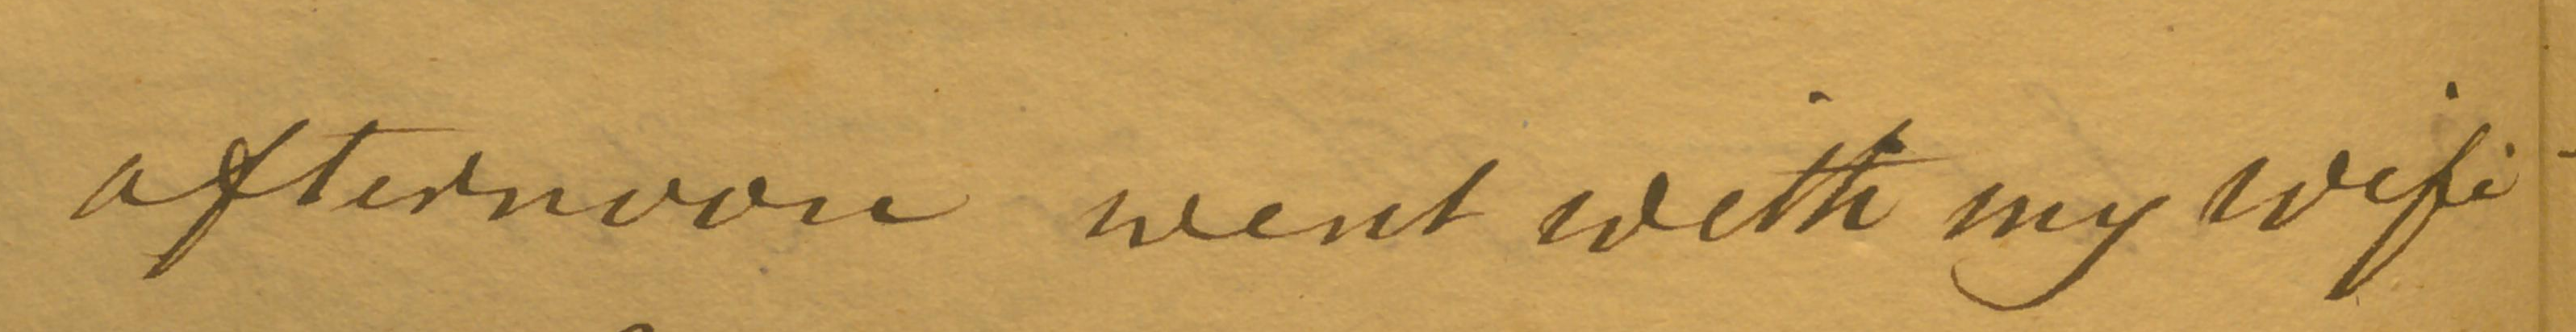afternoon went with my wife
